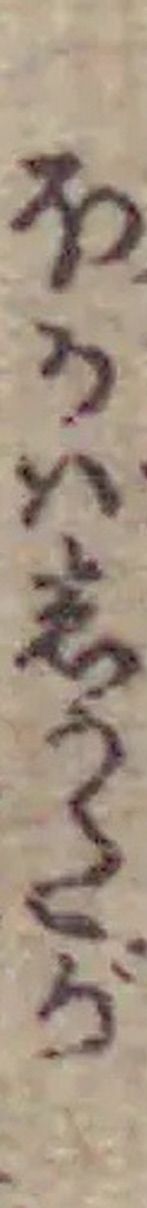ほかはしかたが
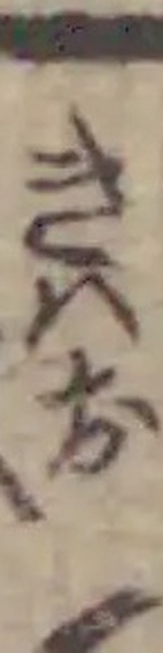きはお
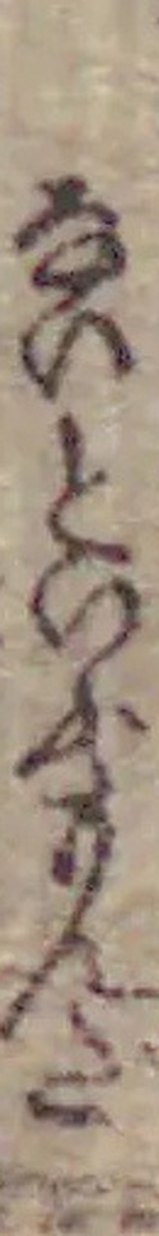ないといふもんだ
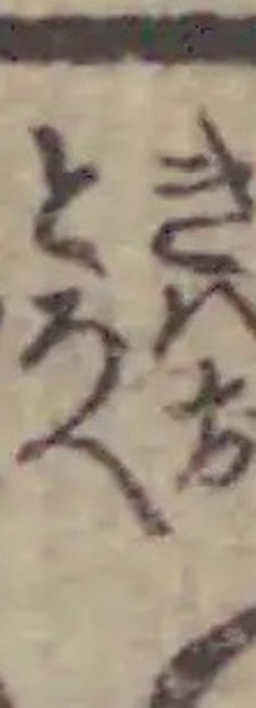とろへ
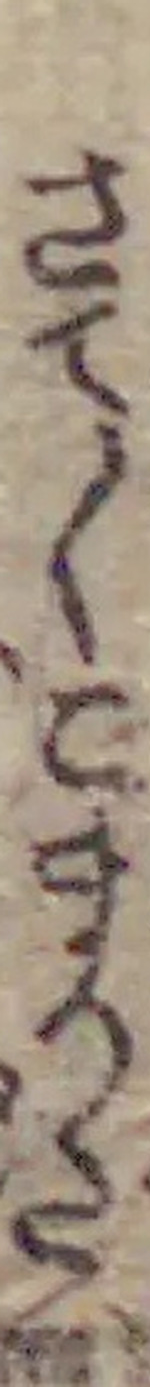さて〳〵こまつた
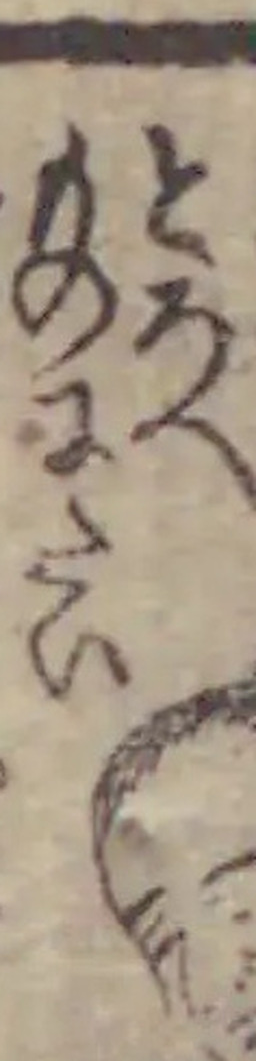ものにたい
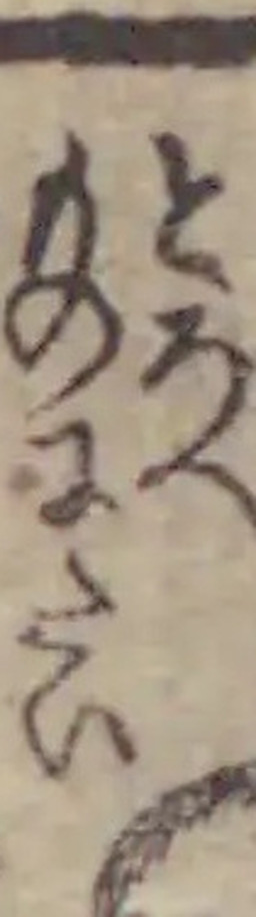ものにたい
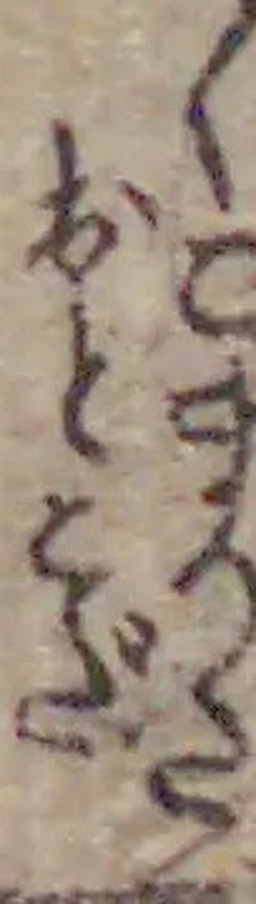おとこだ
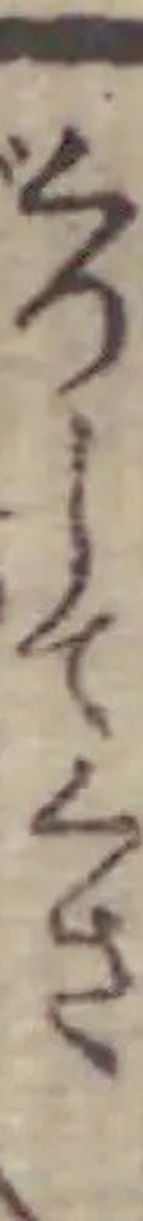くつしてくさ
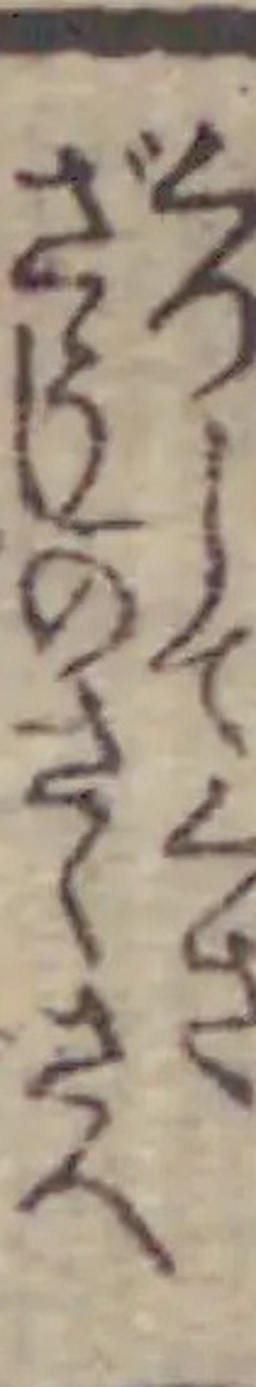ざうしのさくさへ
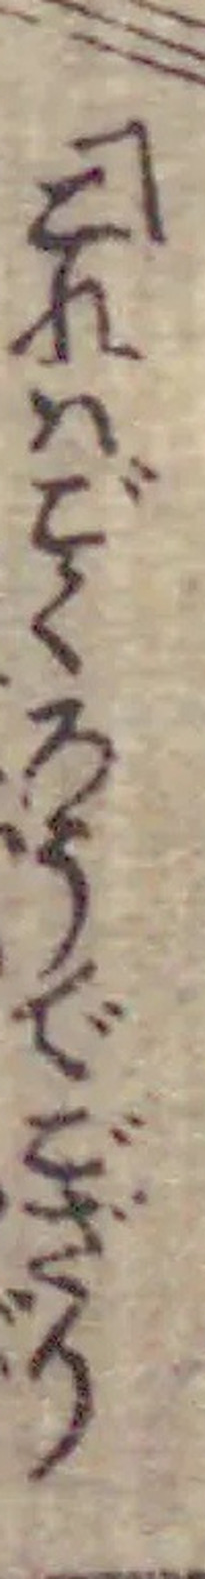〽これはごくろうでござり
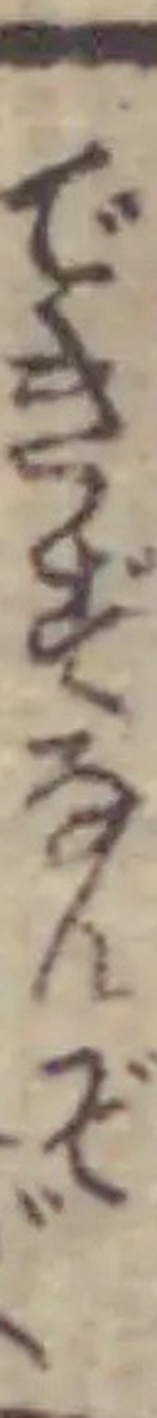できずなんぞ
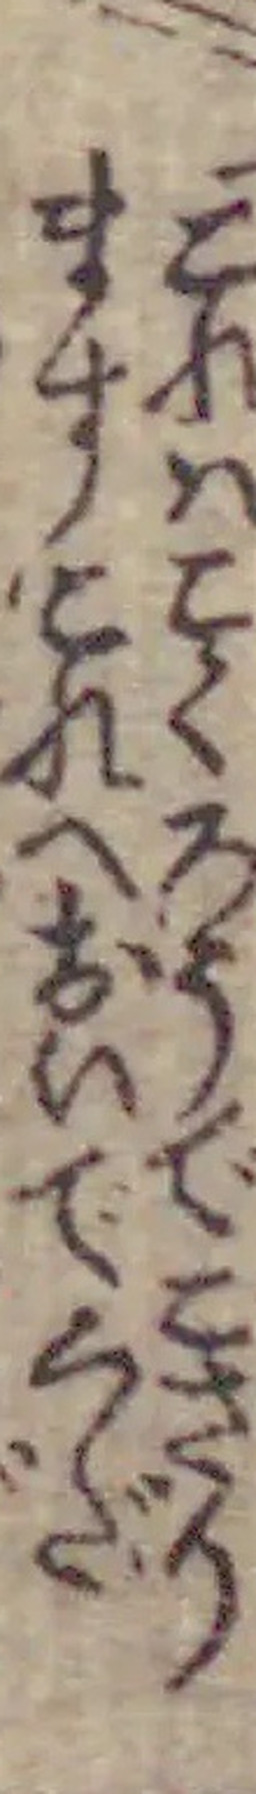ますこれへおいでくだ
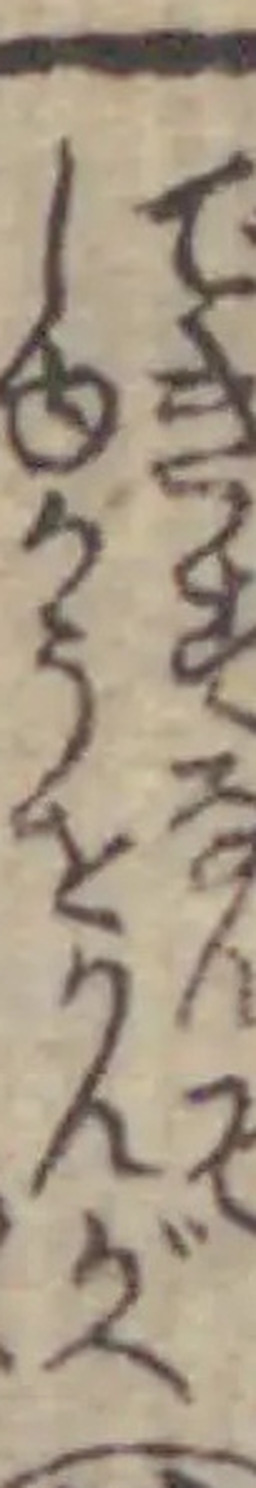しゆかうをかんがへ
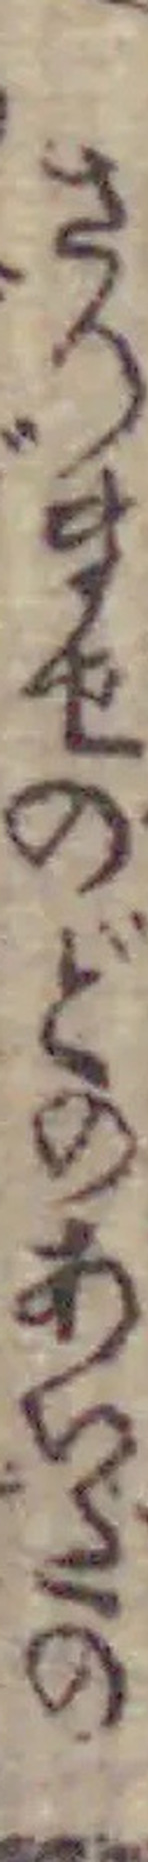さりませのどのあいだの
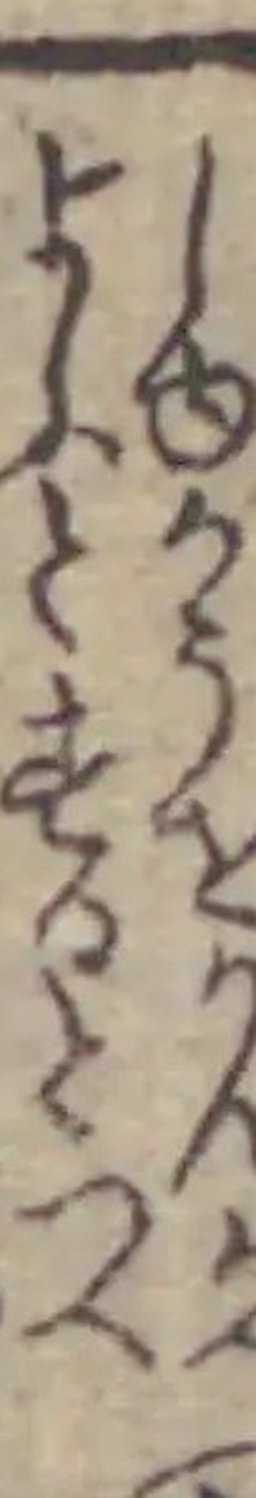よふとするとつへ
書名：腹内養生主論 3巻
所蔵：国立国会図書館 National Diet Library, JAPAN
